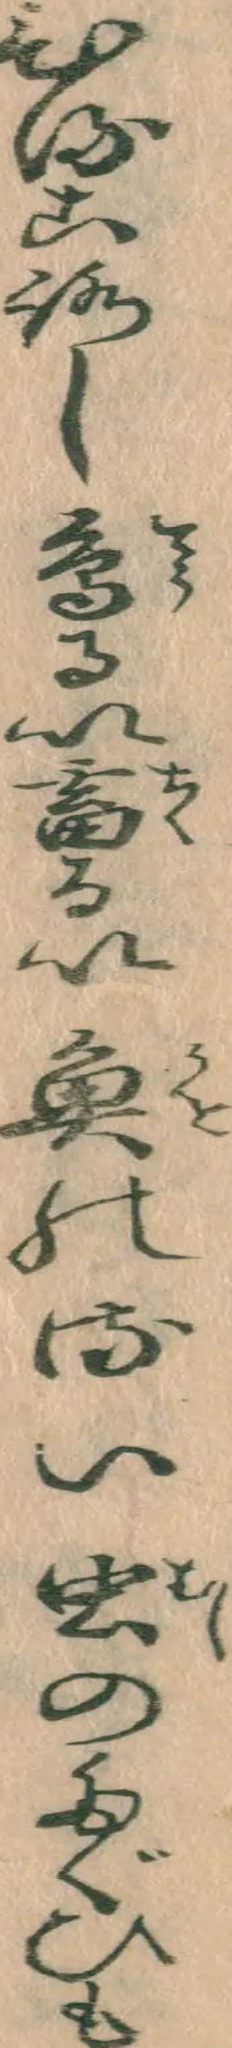ひるころし鳥るい畜るい魚のるい虫のたぐひも
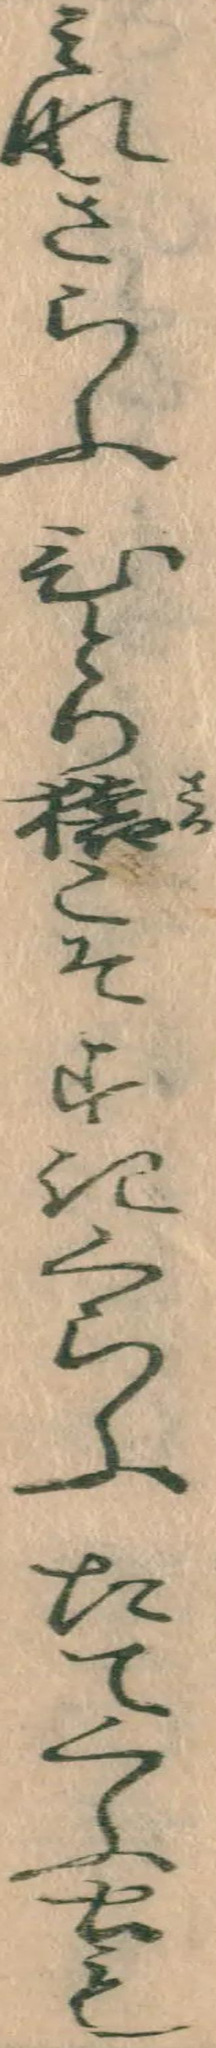みなきらふひとり猿こそすきくらふたてくふ虫も
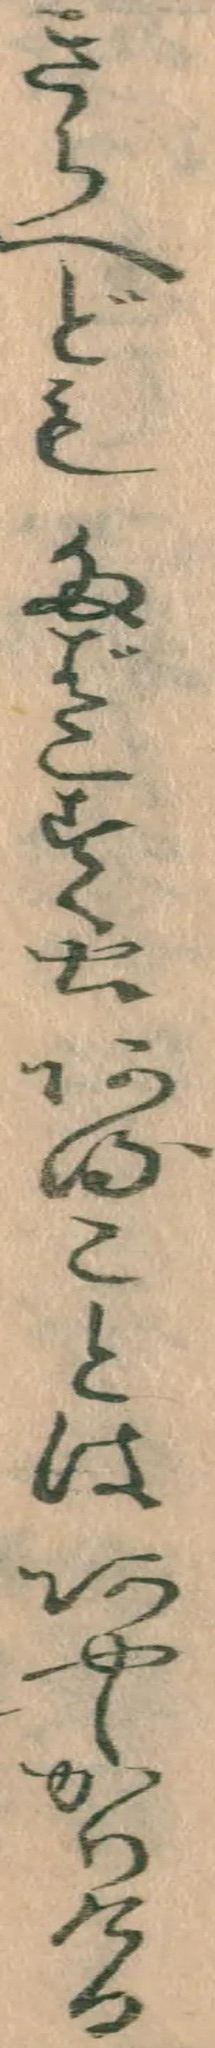きらへどもたばこすく虫あることはあやしかりける
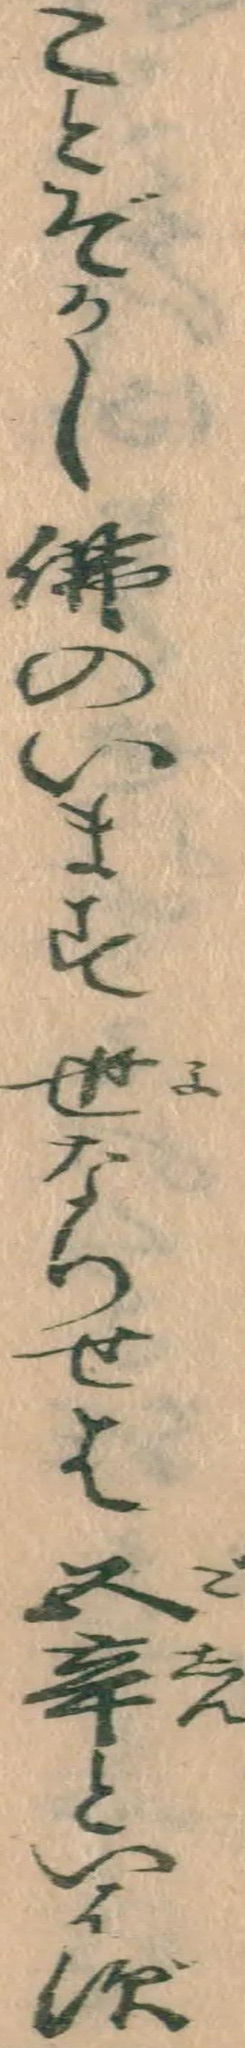ことぞかし仏のいます世なりせは五辛といはず
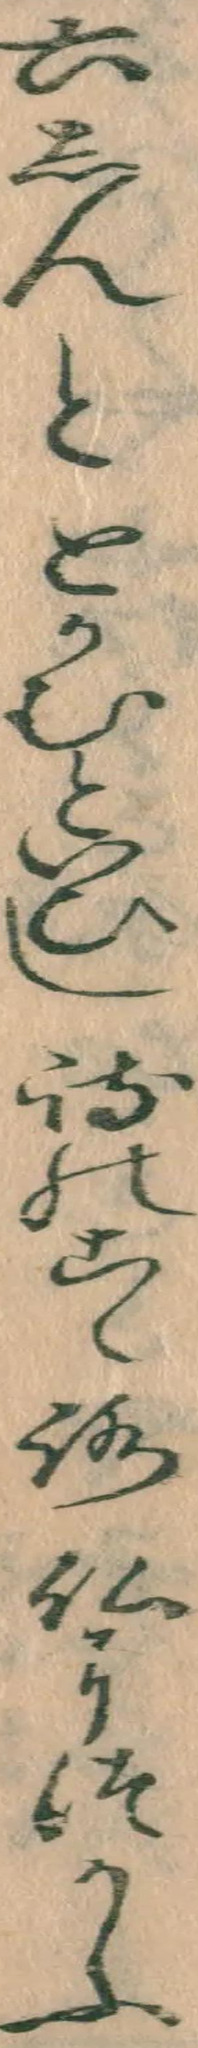六しんととかむといひし詩のこゝろ仏につかふ
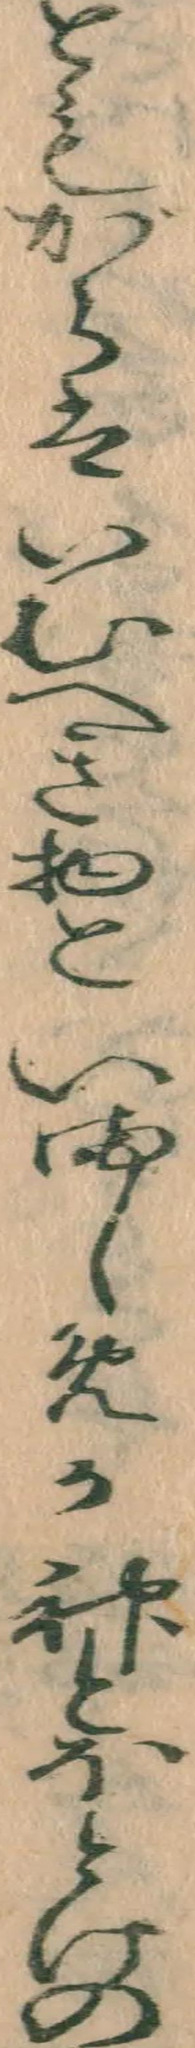ともがらはいむへき物といましめか神とほとけの
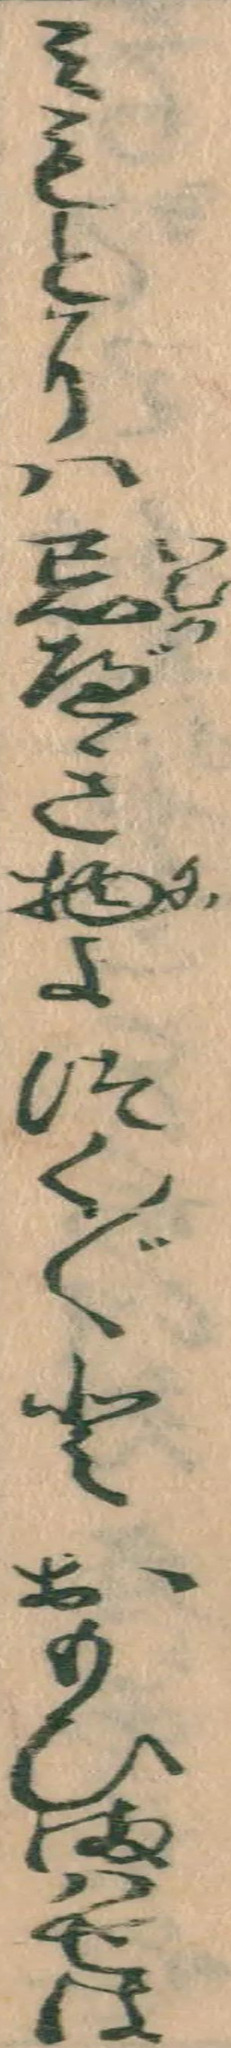みもとには忌べき物につく〴〵とおもひまはせは
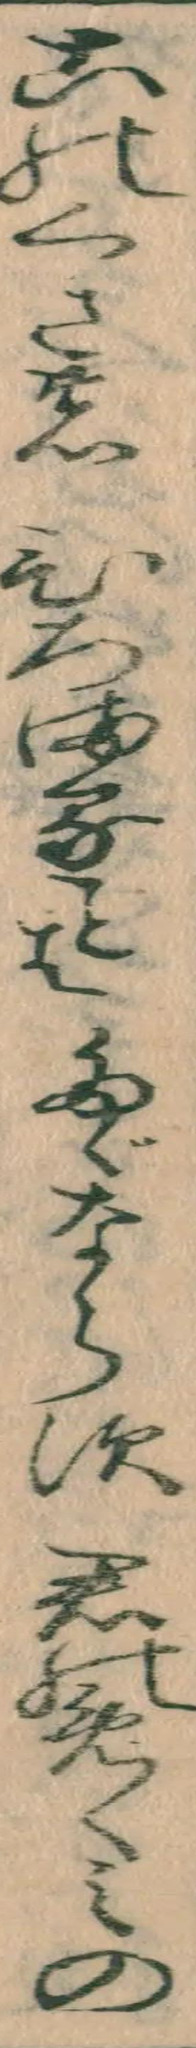このくさのひろまることはたゞならす君のめくみの
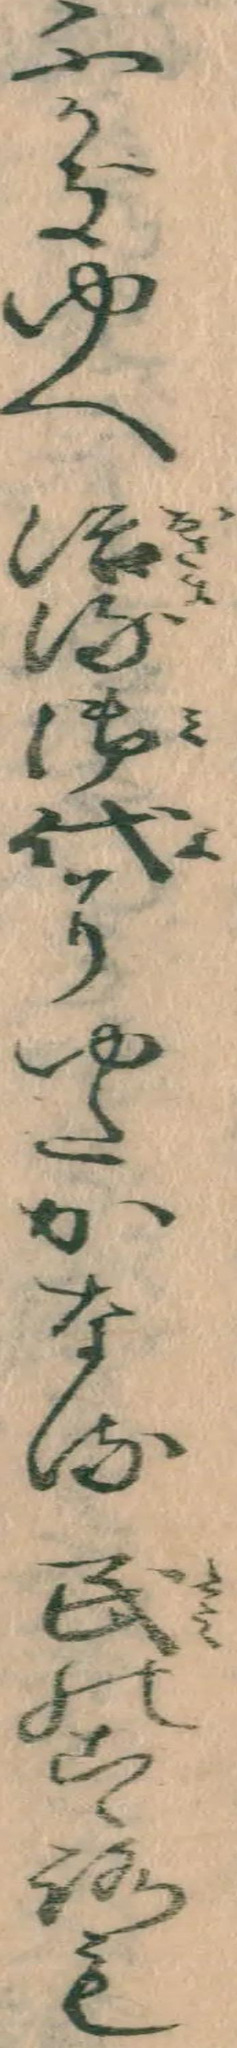ふかきゆへ治る御代にゆたかなる民のこゝろも
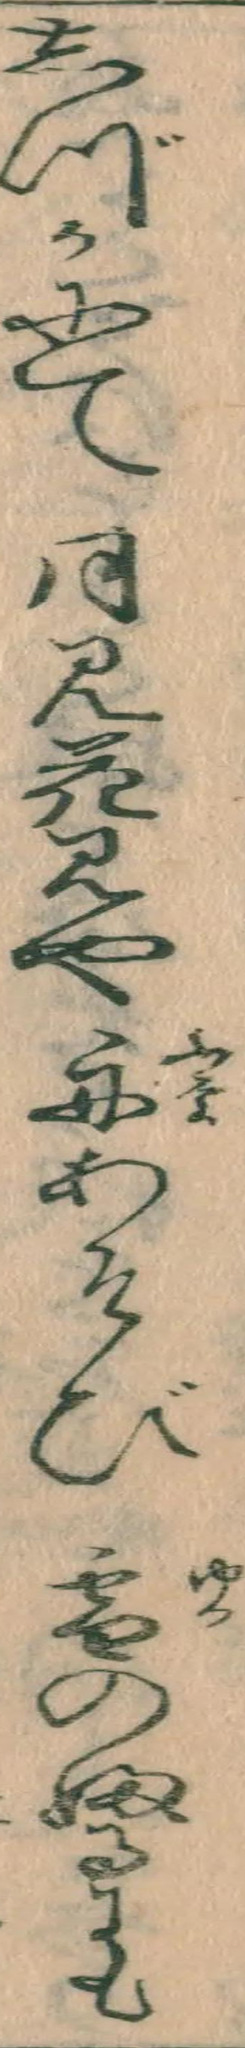しづかにて月見花見や舟あそび雪のふるにも
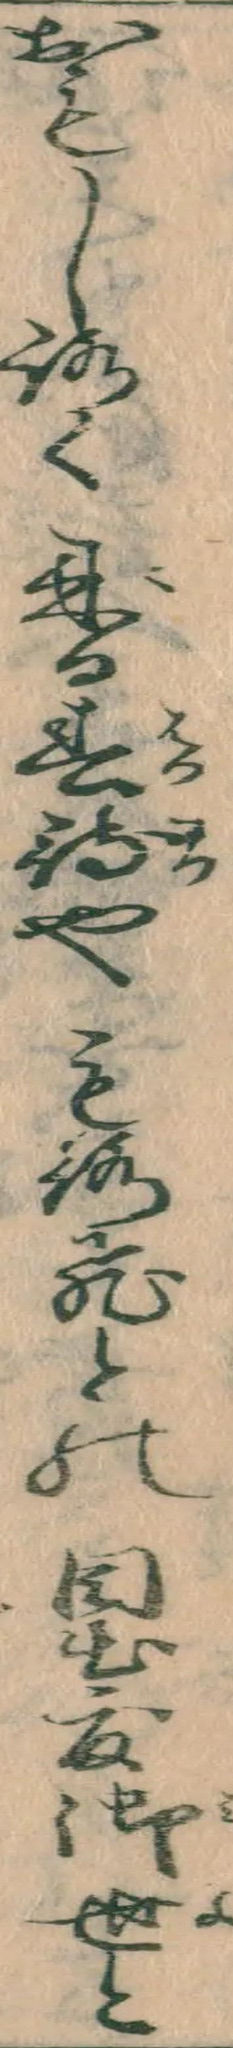おもしろく来る春待やもろひとの目出度御世と
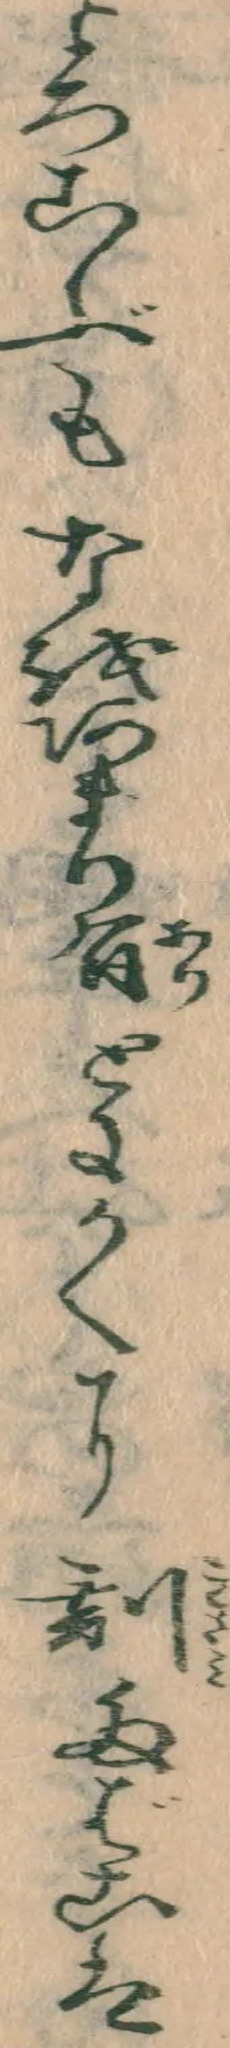よろこぶもなをあまり有とにかくに刻たばこは
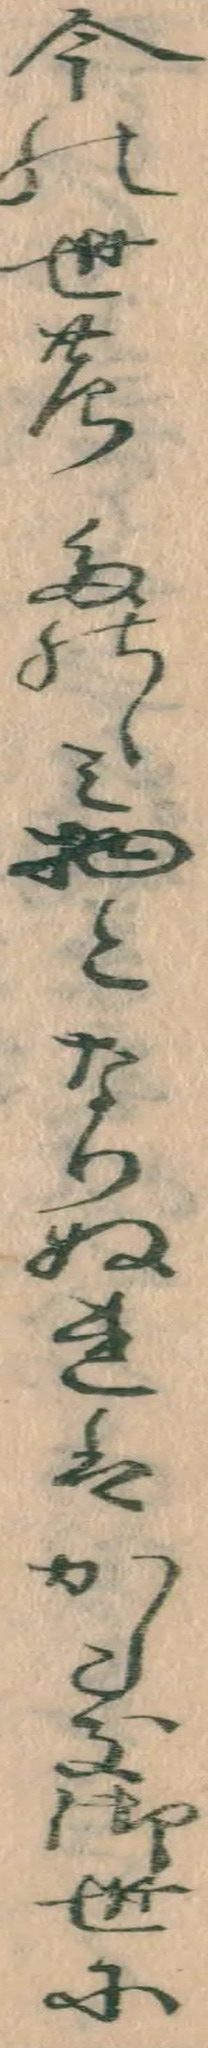今の世のたのしみ物となりぬれはかしこき御世に
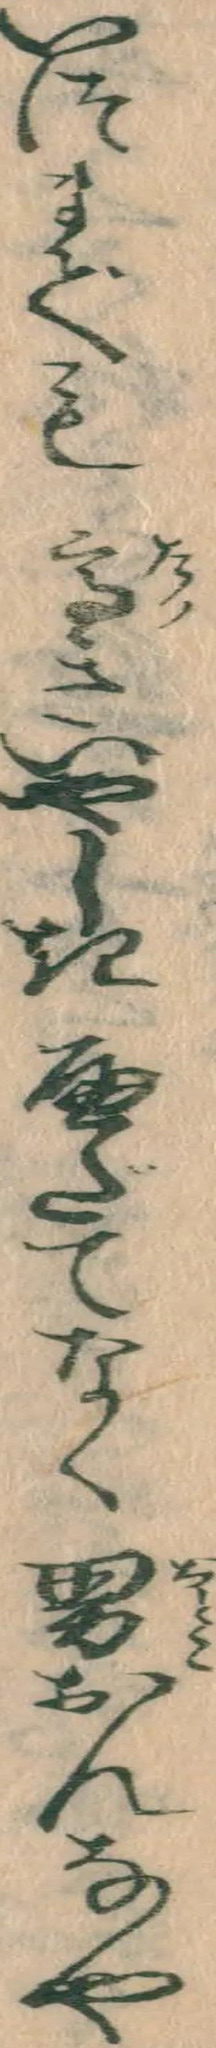いつまでも高きいやしきへだてなく男おんなや
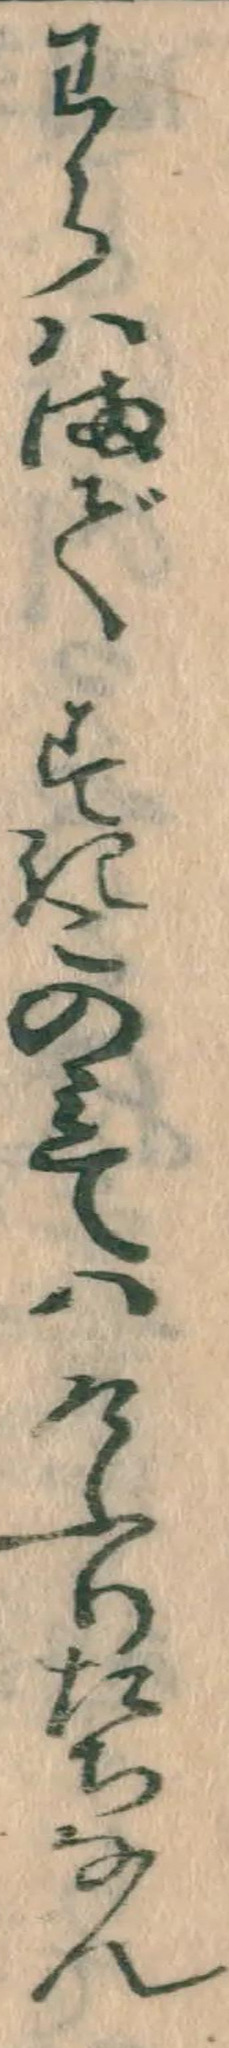わらはまですきこのみてはけふりたちなん
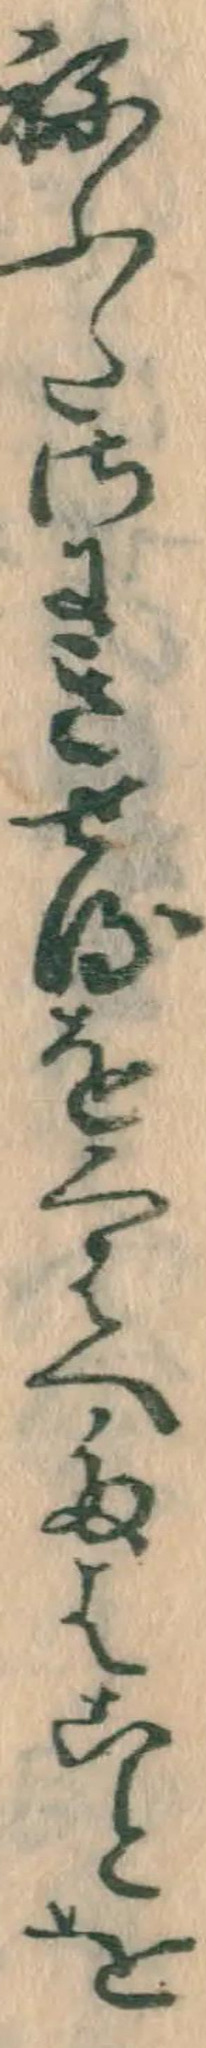ねふたさにきせるをくはへたはことを
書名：煙草記
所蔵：国立国会図書館 National Diet Library, JAPAN
